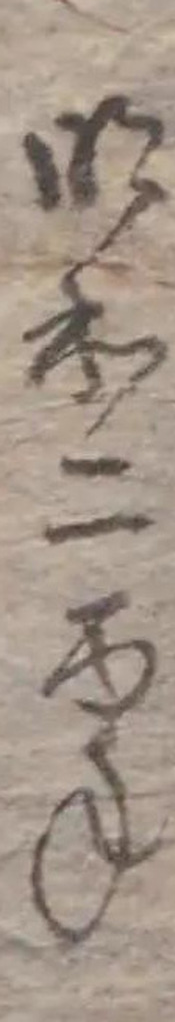明和二酉年
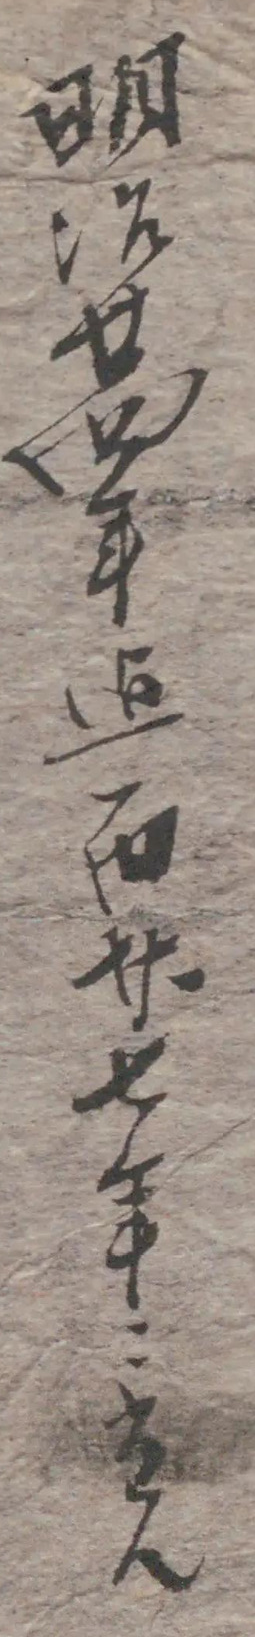明治廿四年迄百廿七年に当る

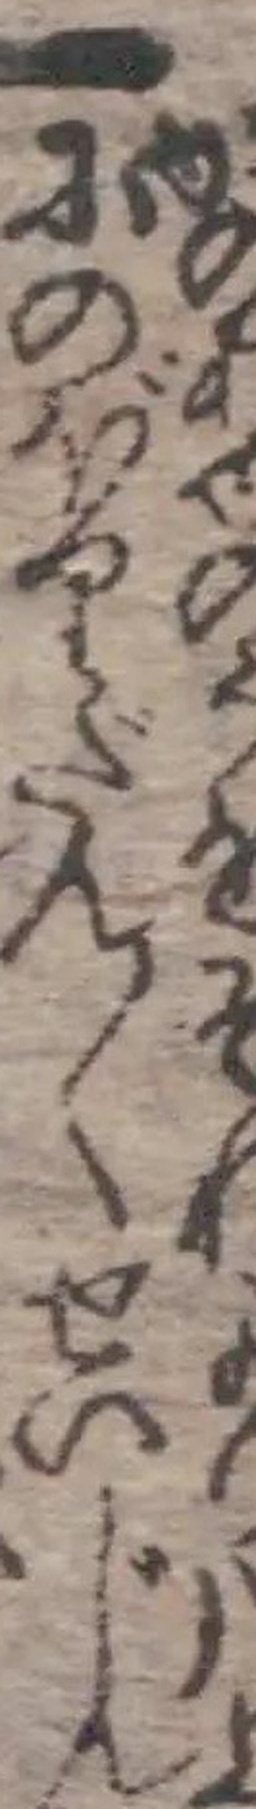にのぼりだん〳〵せいじん
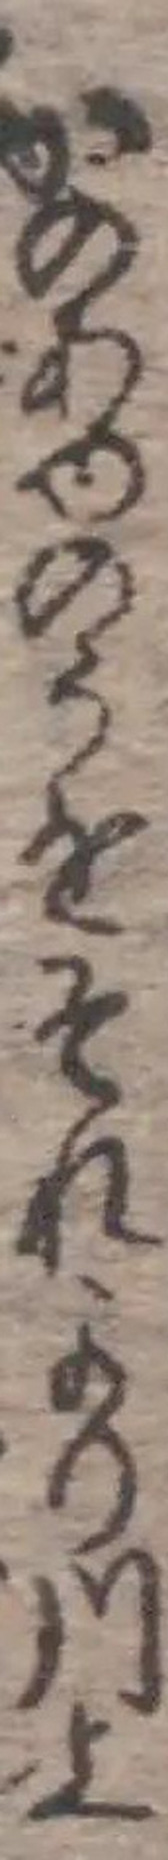かのあゆのうをそれより川上
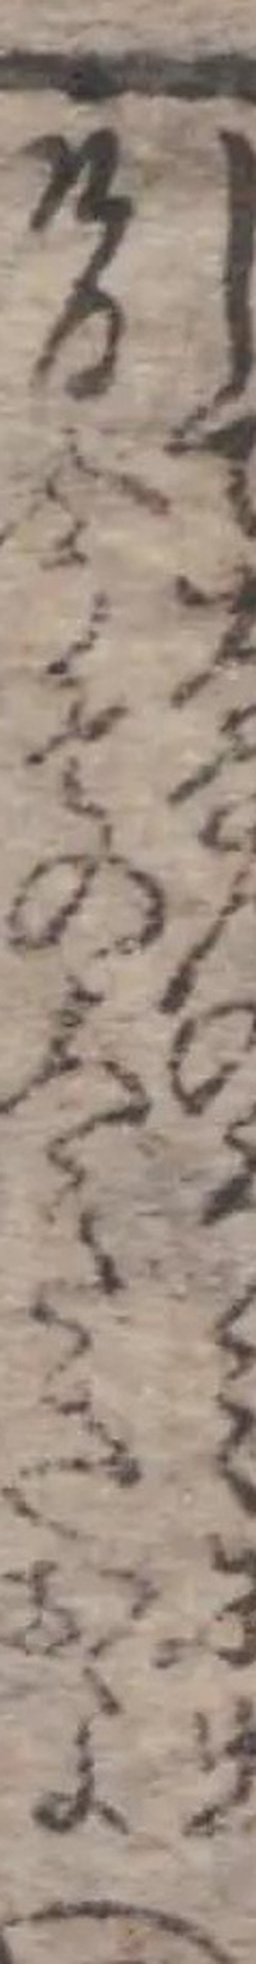ける今その大きさおよ
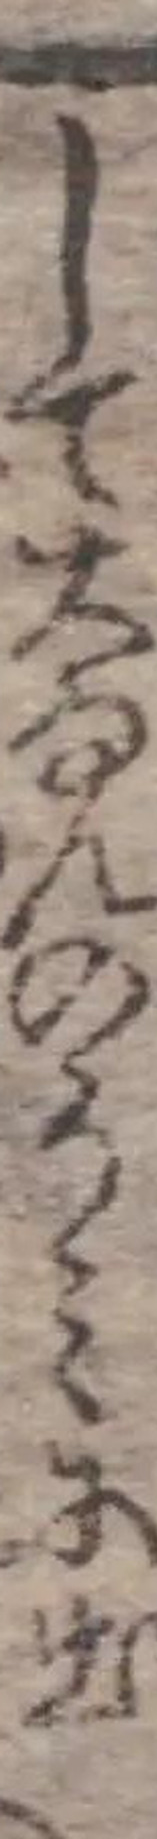して大なんのうみに出
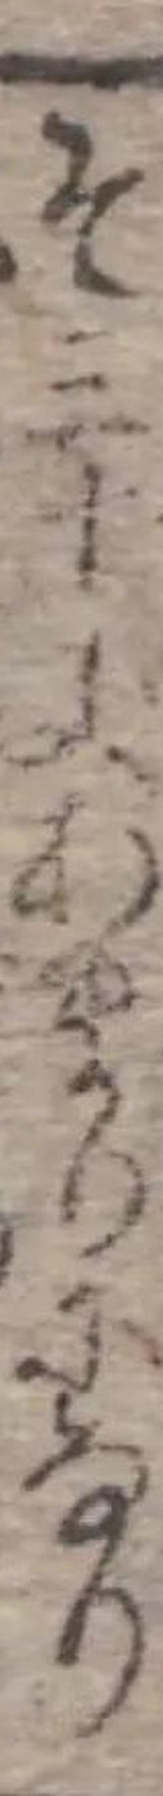そ三十丈あまりになり
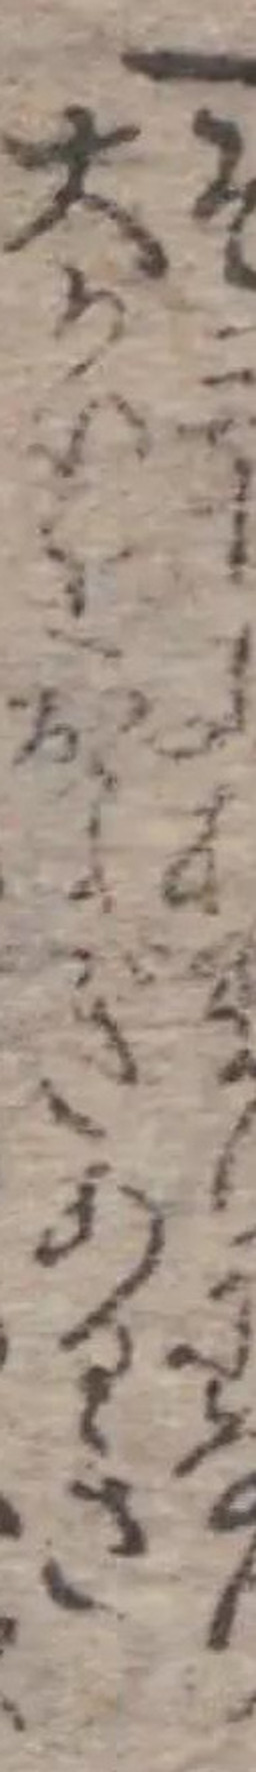大かいをおよぎあるき
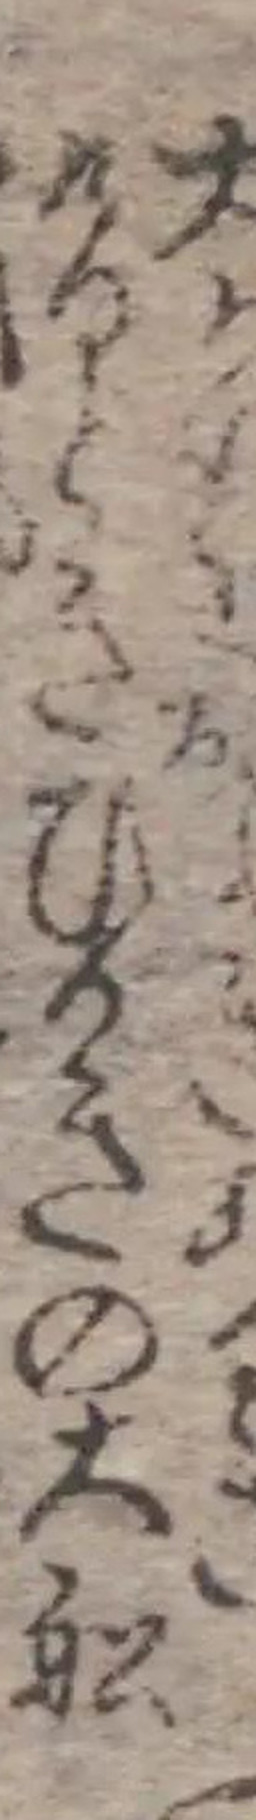けるときひかきの大船
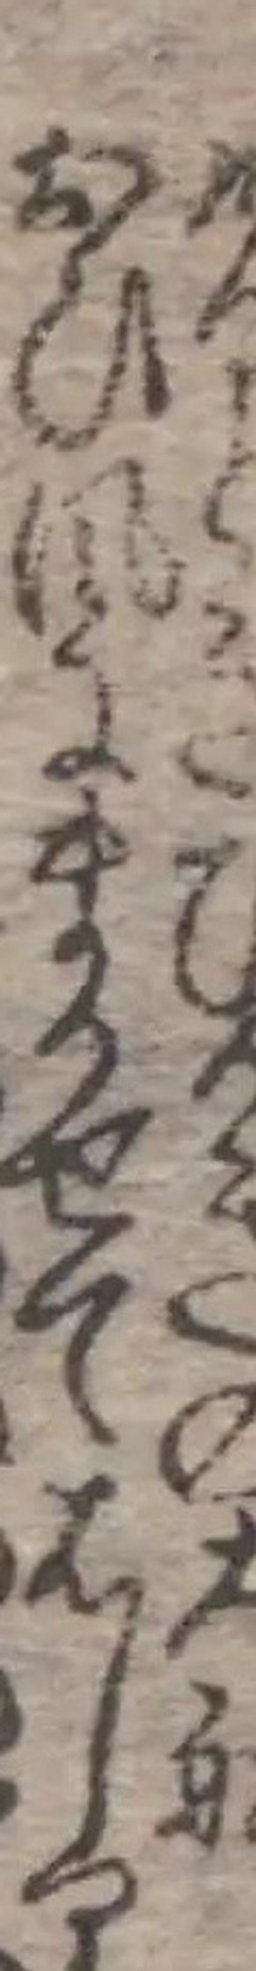おひ風にまかせてはしり
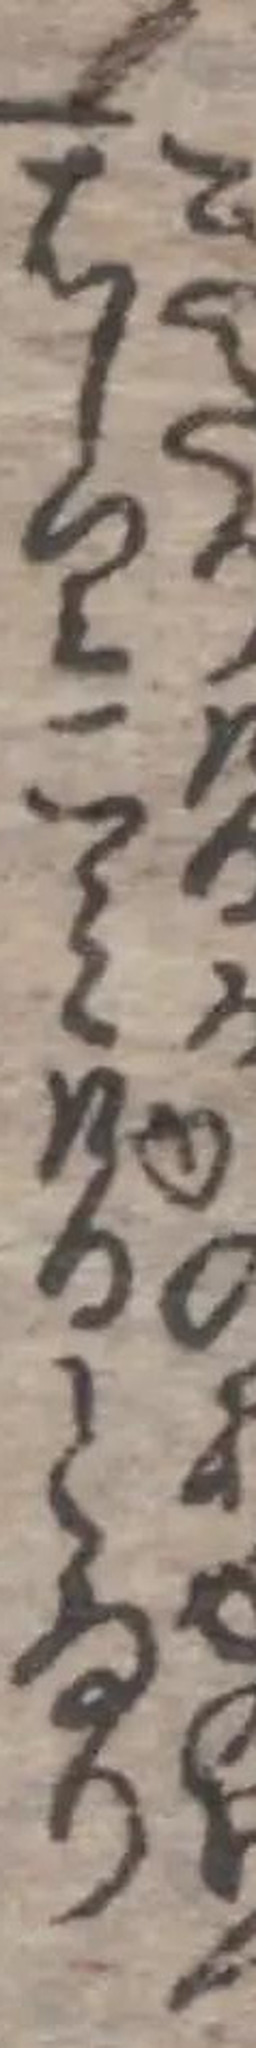はしりこみけることなり
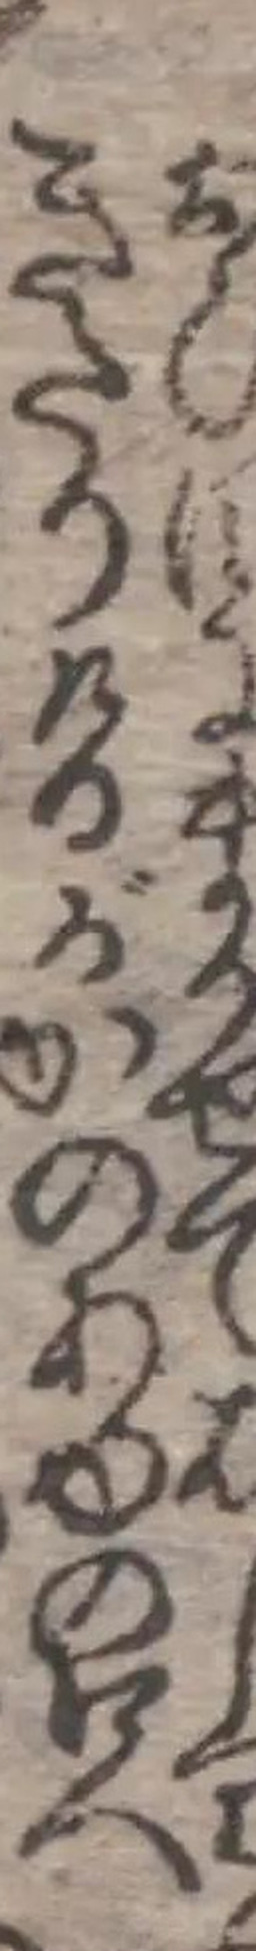きたりけるがかのあゆの口へ
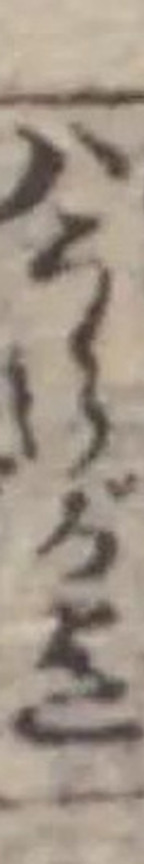はうらが迄
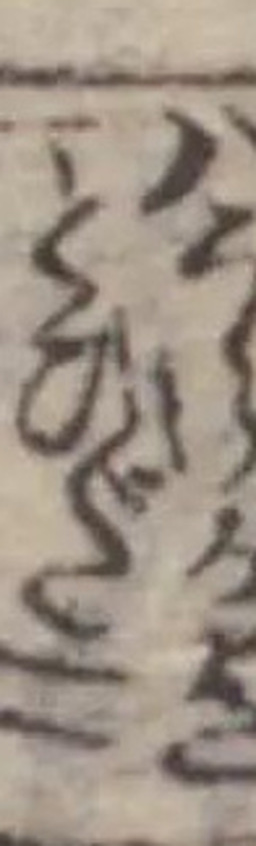一とひだ
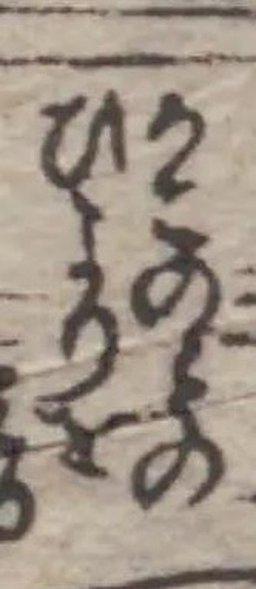ひよりを
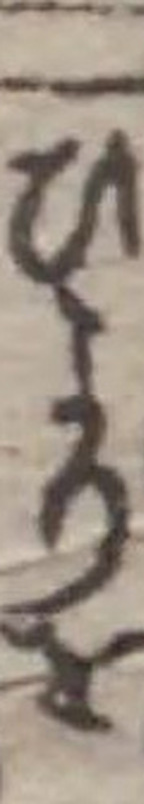ひよりを
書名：五たいそう
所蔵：国立国会図書館 National Diet Library, JAPAN
